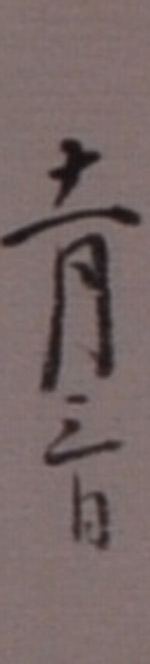十一月三日
